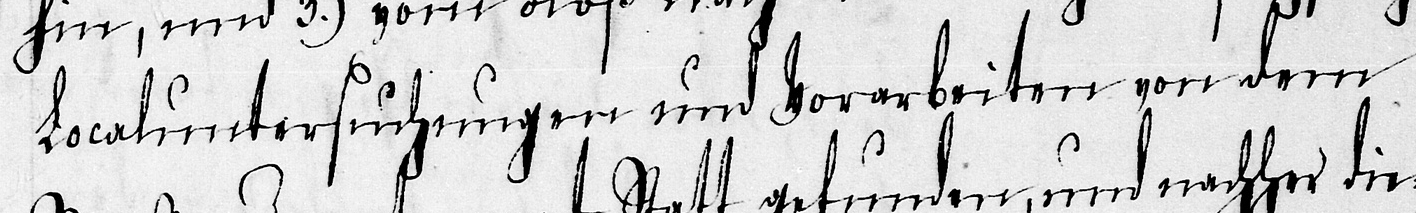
Localuntersuchungen und Vorarbeiten von dem
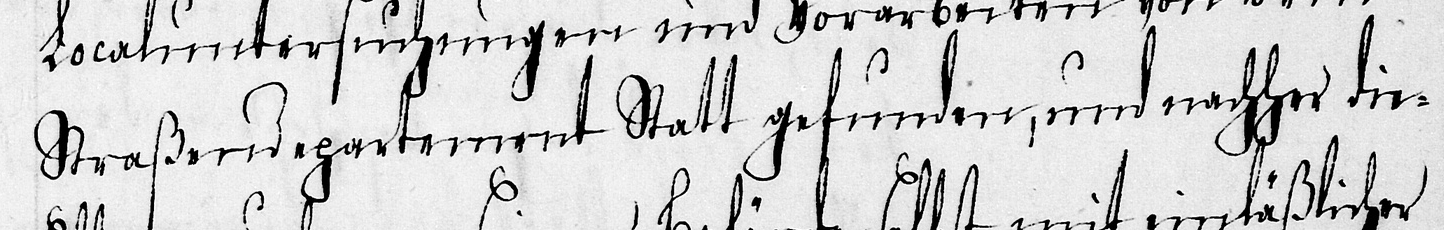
Straßendepartement Statt gefunden, und nachher die¬
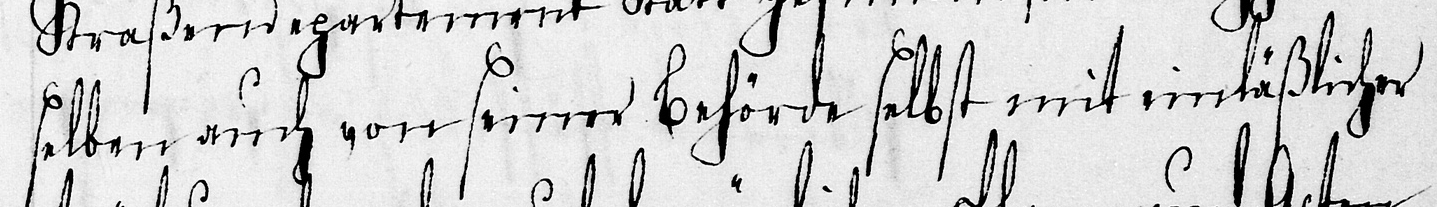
selben auch von seiner Behörde selbst mit einläßlicher
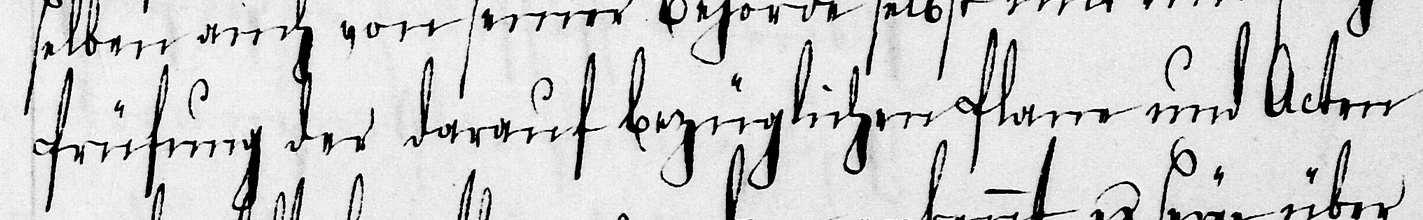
Prüfung der darauf bezüglichen Plane und Acten
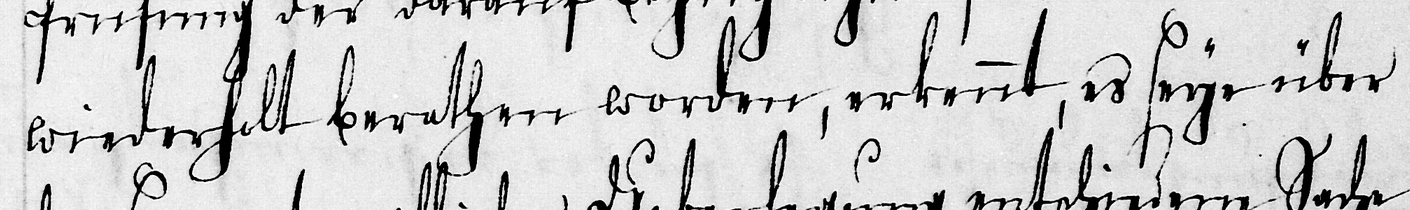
wiederholt berathen worden, erkennt, es seye über
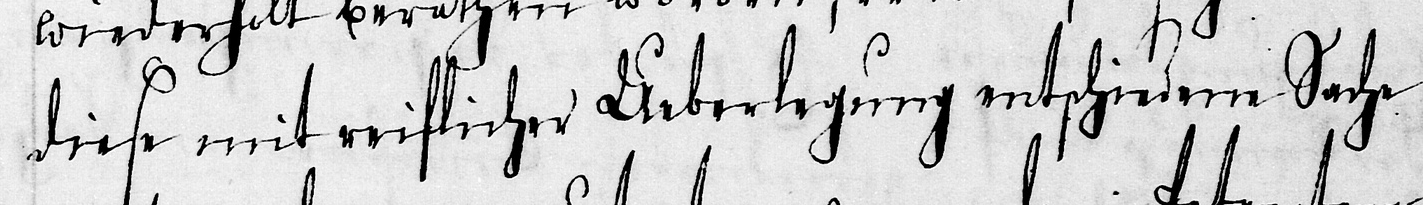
diese mit reiflicher Ueberlegung entschiedene Sache
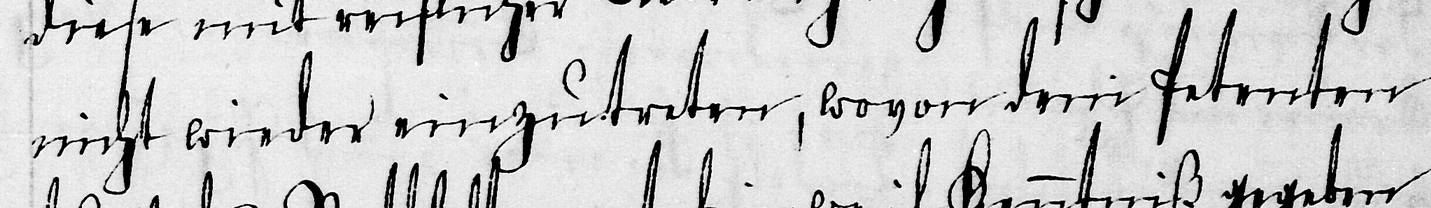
nicht wieder einzutreten, wovon dem Petenten
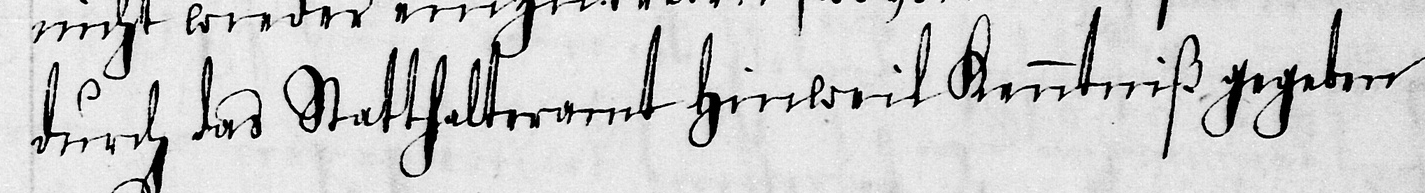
durch das Statthalteramt Hinweil Kenntniß gegeben
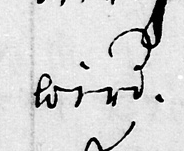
wird.
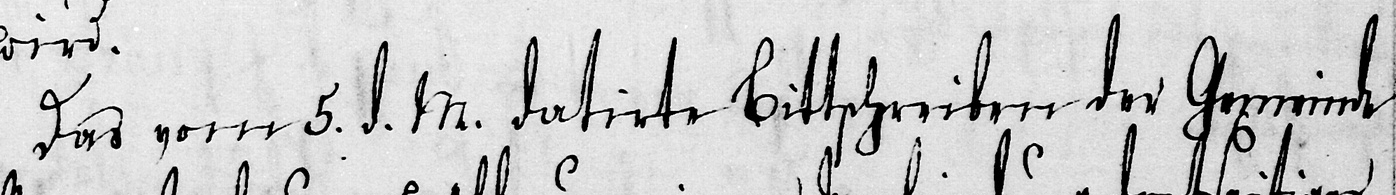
Das vom 5. d. M. datirte Bittschreiben der Gemeinde
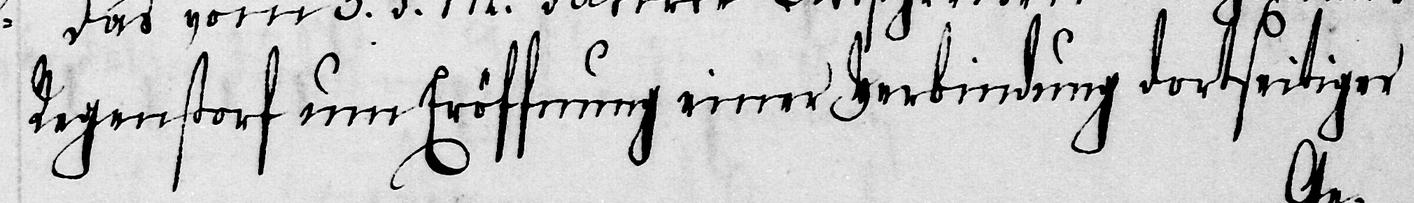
Regenstorf um Eröffnung einer Verbindung dortseitiger
